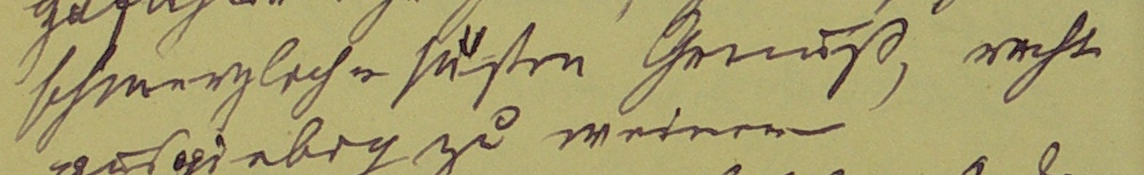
schmerzlich en süßen Genuß , recht
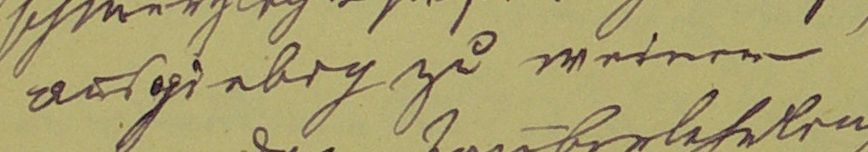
ausgiebig zu weinen.—
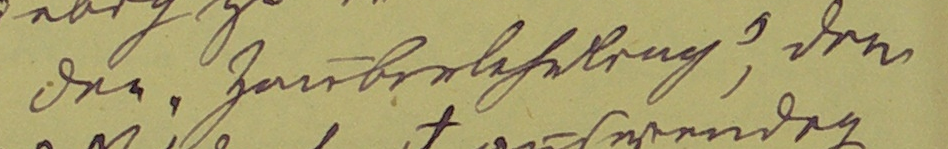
Den Zauberlehrling den
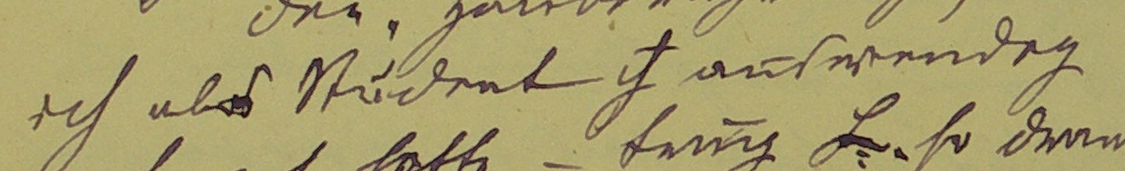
ich als Student auch auswendig
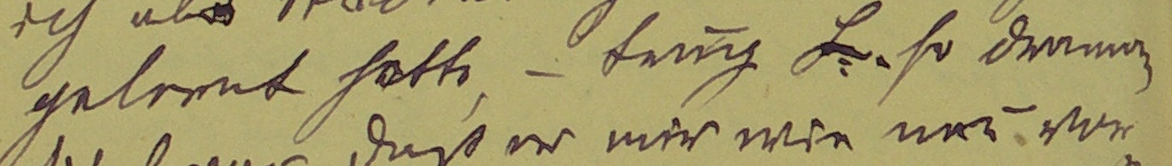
gelernt hatte,- trug L. so drama¬
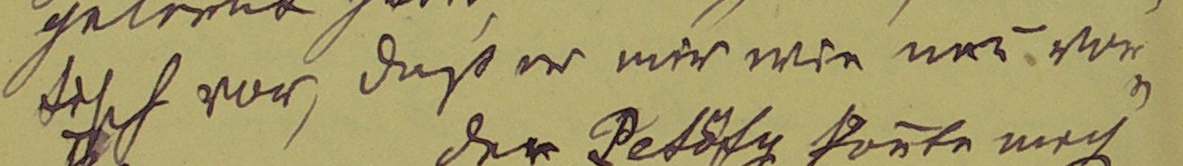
tisch vor , daß er mir wie neu vor¬
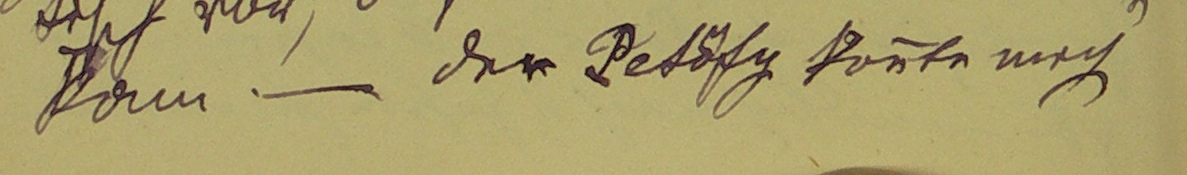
kam.—Der Petöfy konnte noch
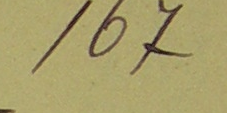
167
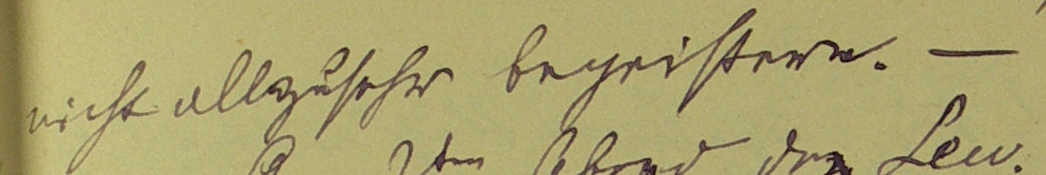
nicht allzusehr begeistern.—
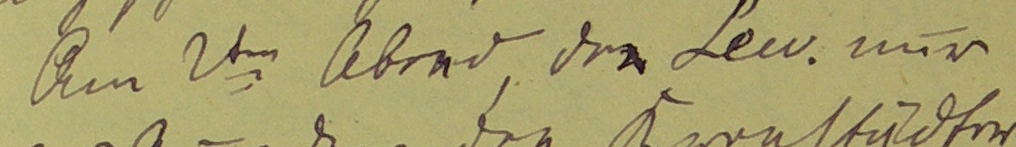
Am 2-ten Abend, den Lewinsky nur
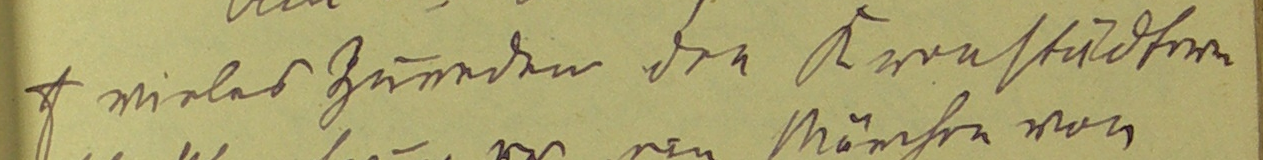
mit vielen Zureden den Kronstädter
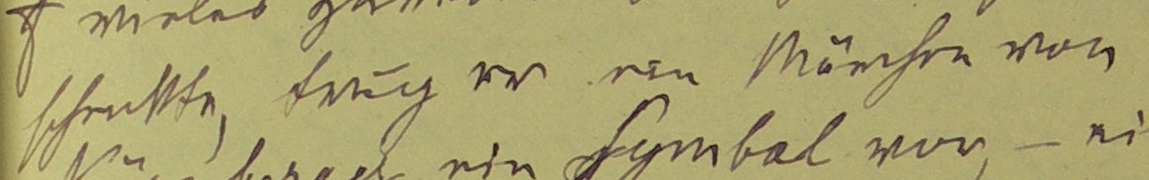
schenkte , trug er Märchen von
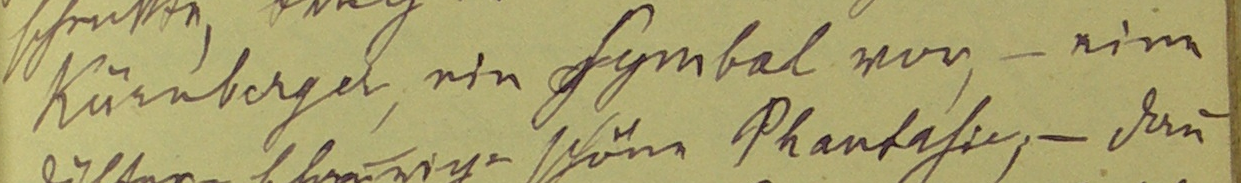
Kürnberger , ein Symbol vor,--eine
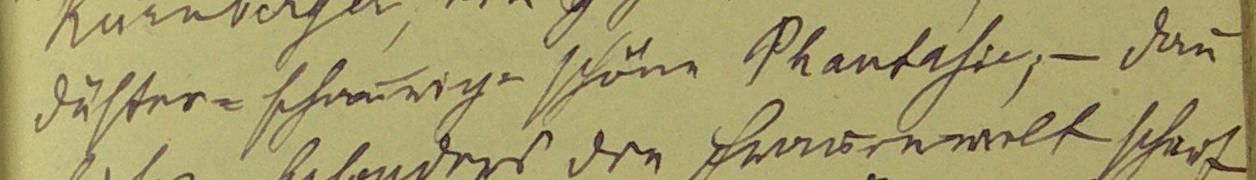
düster= schaurige schöne Phantasie;- dann
